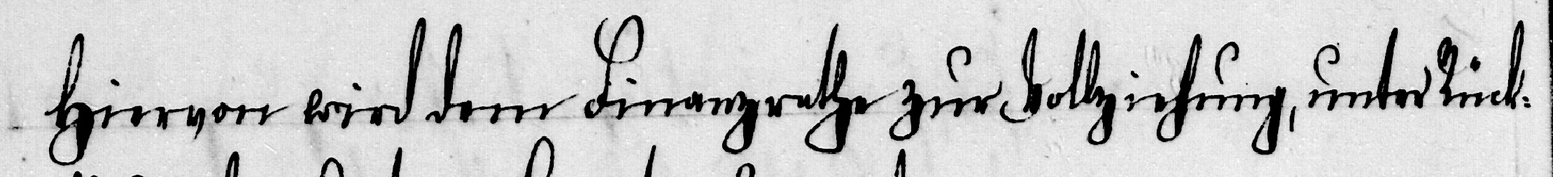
Hiervon wird dem Finanzrathe zur Vollziehung, unter Rüc¬
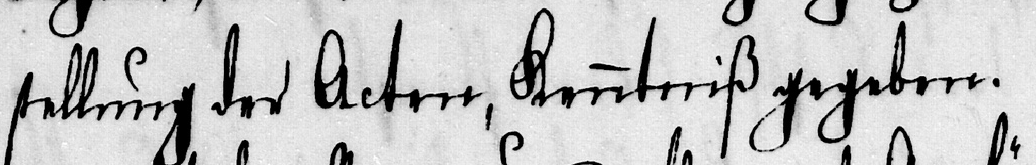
tellung der Acten, Kenntniß gegeben.
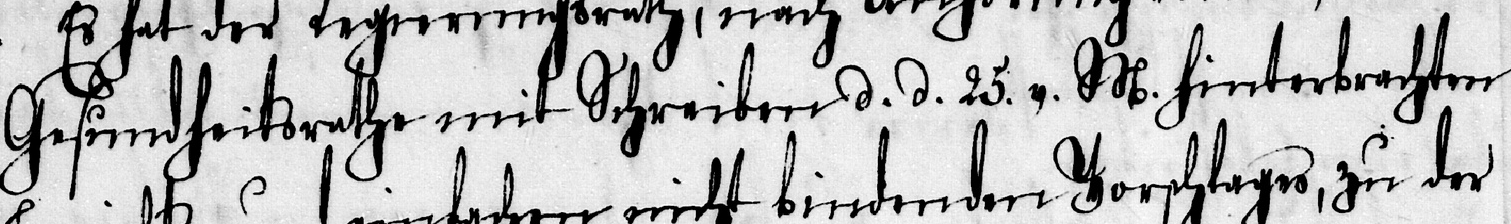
Gesundheitsrathe mit Schreiben d. d. 25. v. M. hinterbrachten
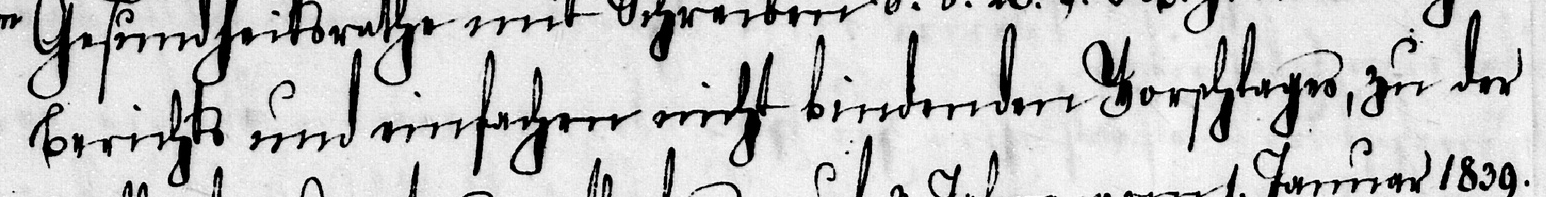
Berichts und einfachen nicht bindenden Vorschlages, zu der
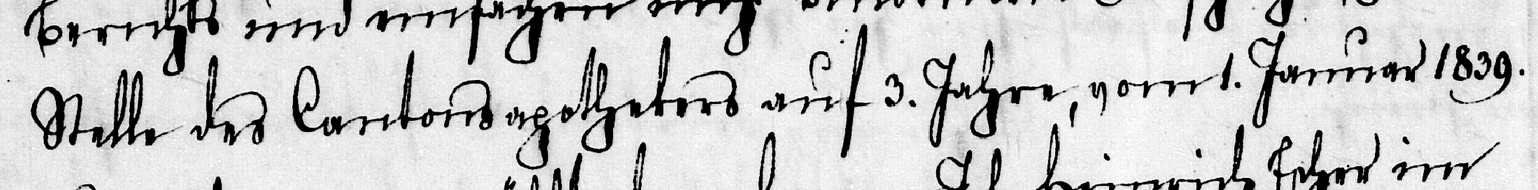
Stelle des Cantonsapothekers auf 3. Jahre, vom 1. Januar 1839.
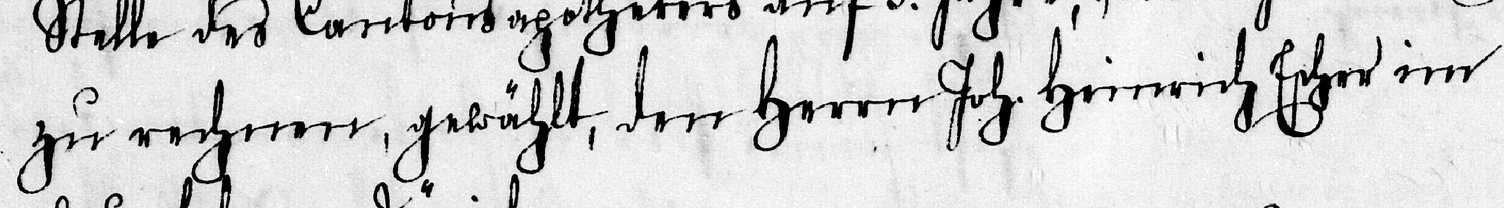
zu rechnen, gewählt, den Herrn Joh. Heinrich Escher im
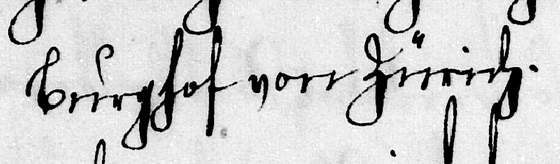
Burghof von Zürich.
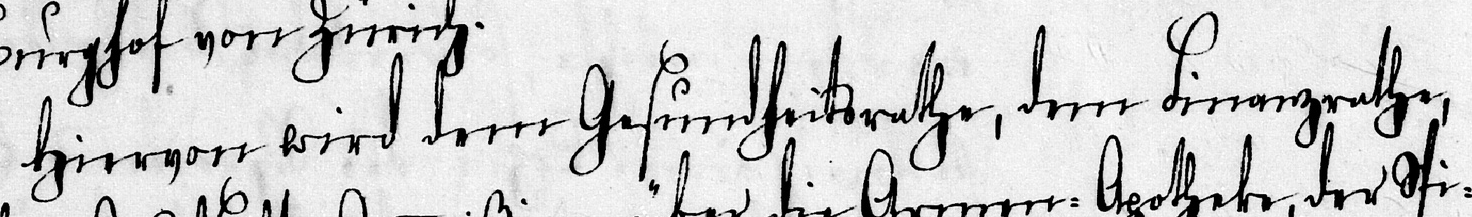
Hiervon wird dem Gesundheitsrathe, dem Finanzrathe,
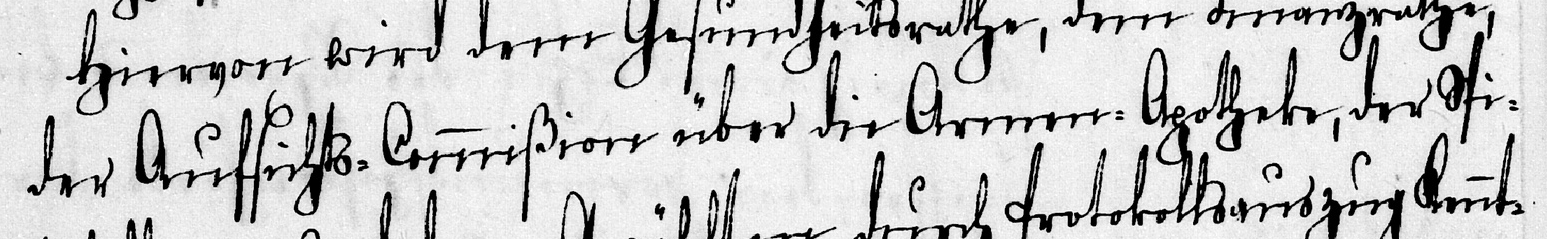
der Aufsichts-Commißion über die Armen-Apotheke, der Spi¬
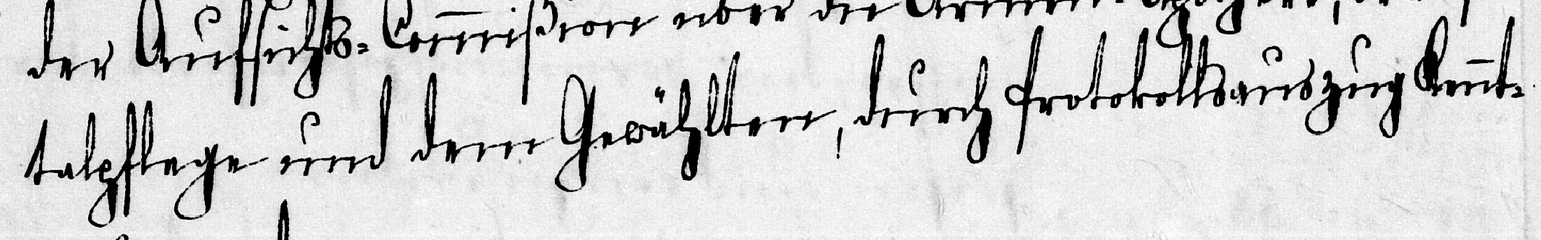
talpflege und dem Gewählten, durch Protokollsauszug Kenn¬
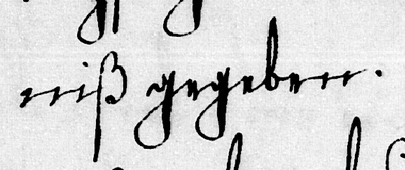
tniß gegeben.
